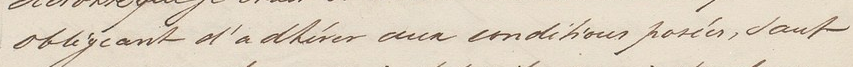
obligeant d'adhérer aux conditions posées, sont
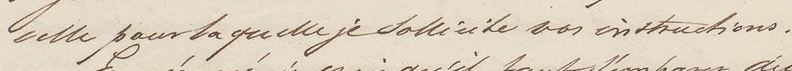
celle pour laquelle je sollicite vos instructions.
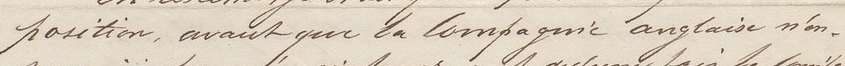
position, avant que la Compagnie anglaise n'en-
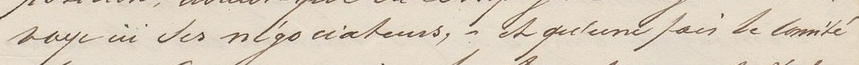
voye ici ses négociateurs, – et qu'une fois le Comité
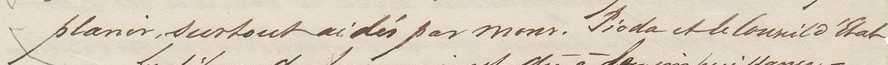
planir, surtout aidés par Mons. Pioda et le Conseil d'Etat.
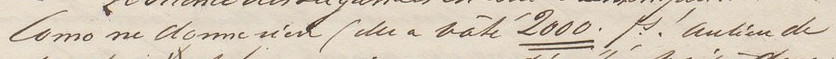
Como ne donne rien (elle a vôté 2000. Fs ! Aulieu de
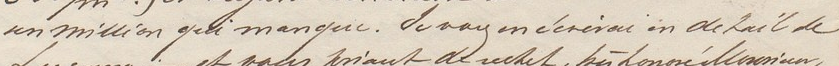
un million qui manque. Je vous en écrirai en detail de
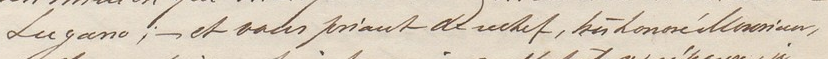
Lugano;– et vous priant de re..., très honoré Monsieur,
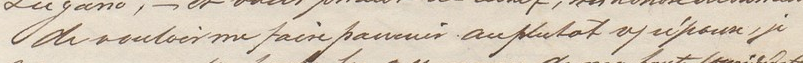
de vouloir me faire parvenir auplutôt votre réponse, je
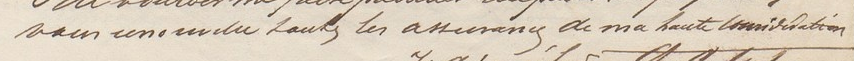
vous renouvelle touts les assurances de ma haute consideration
